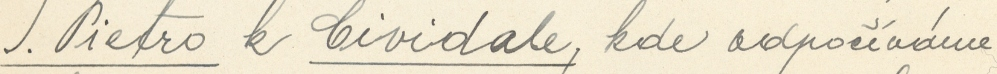S. Pietro k Cividale, kde odpočíváme.
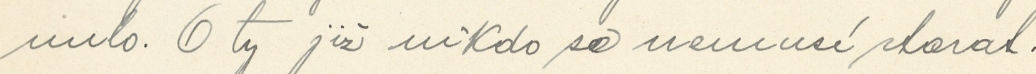nulo. O ty již nikdo se nemusí starat.
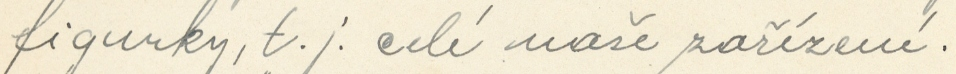figurky, t. j. celé naše zařízení.
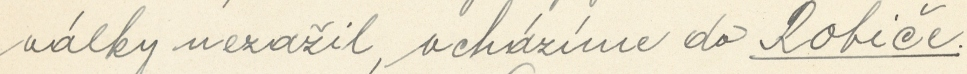války nezažil, vcházíme do Robiče.
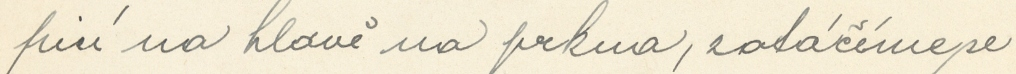picí na hlavě na prkna, zatáčíme se
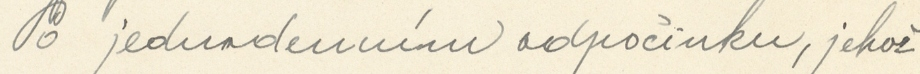Po jednodenním odpočinku, jehož
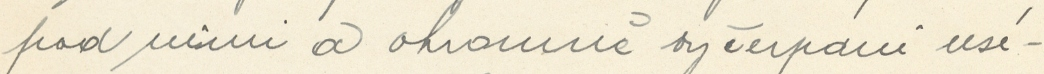pod nimi a ohromně vyčerpáni usí-
